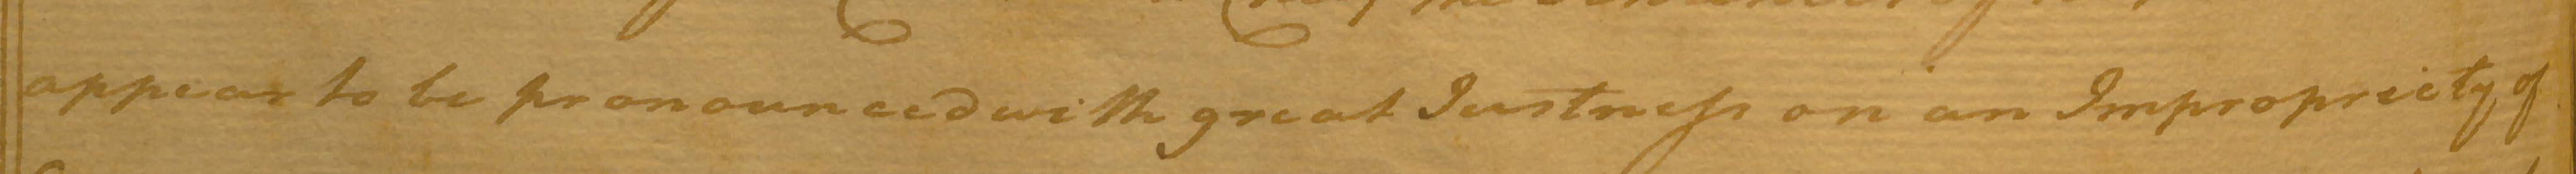appear to be pronounced with great Justness on an Impropriety of
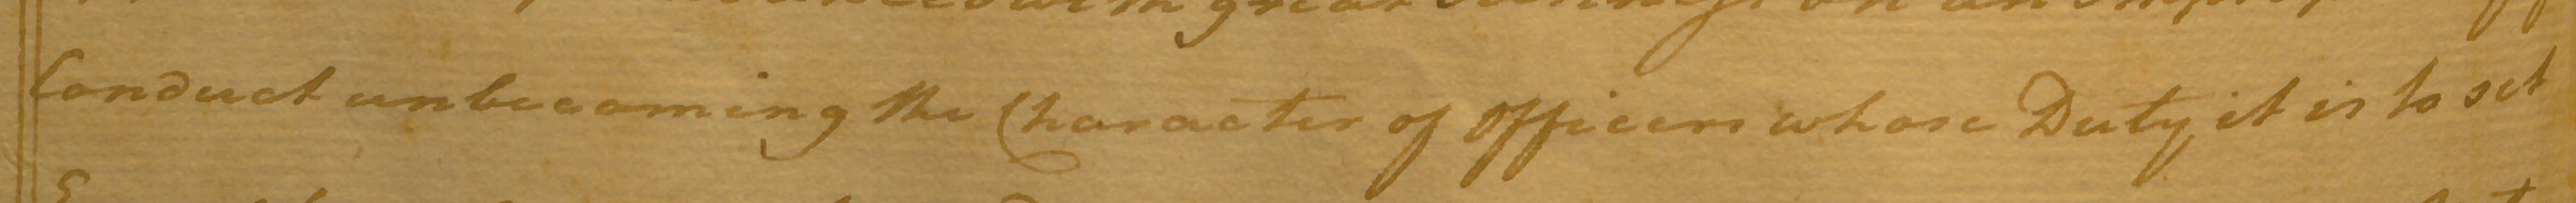Conduct unbecoming the Character of Officers whose Duty it is to set
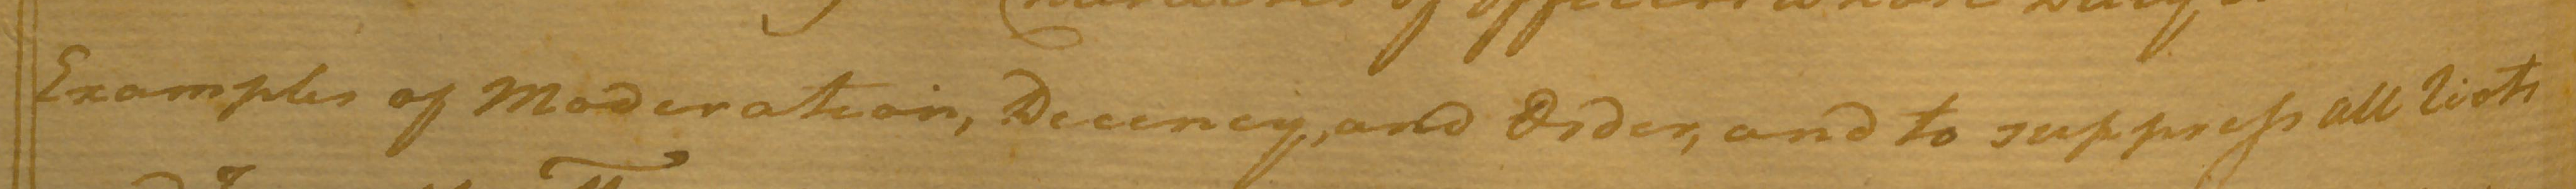Examples of Moderation, Decency, and Order, and and to suppress all riots
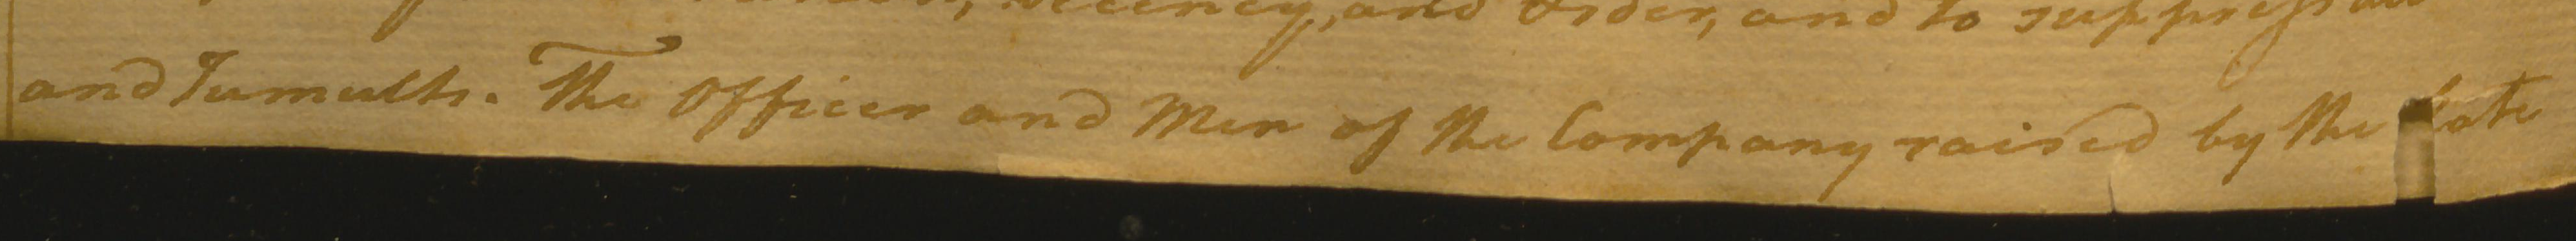and Tumults. The Officer and Men of the Company raised by the State
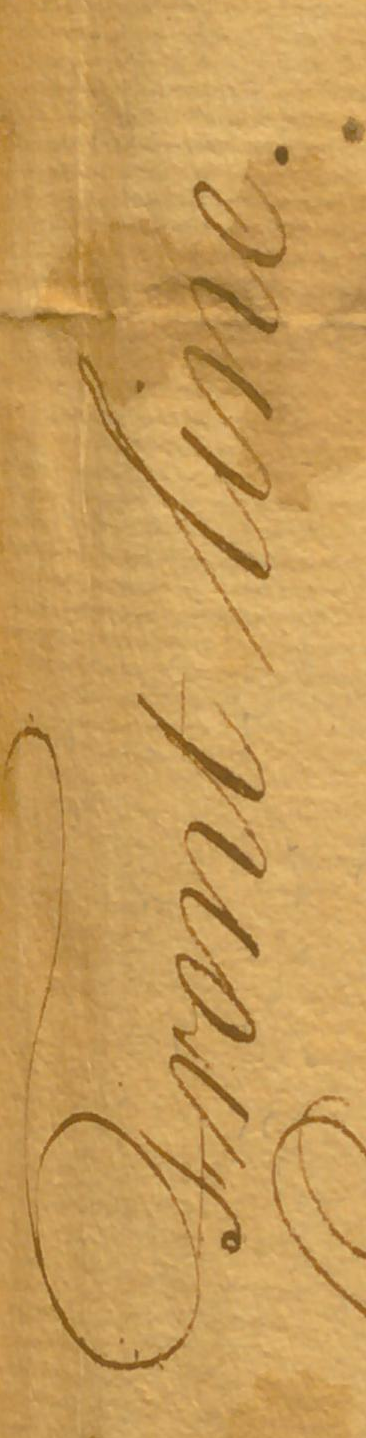Front line.
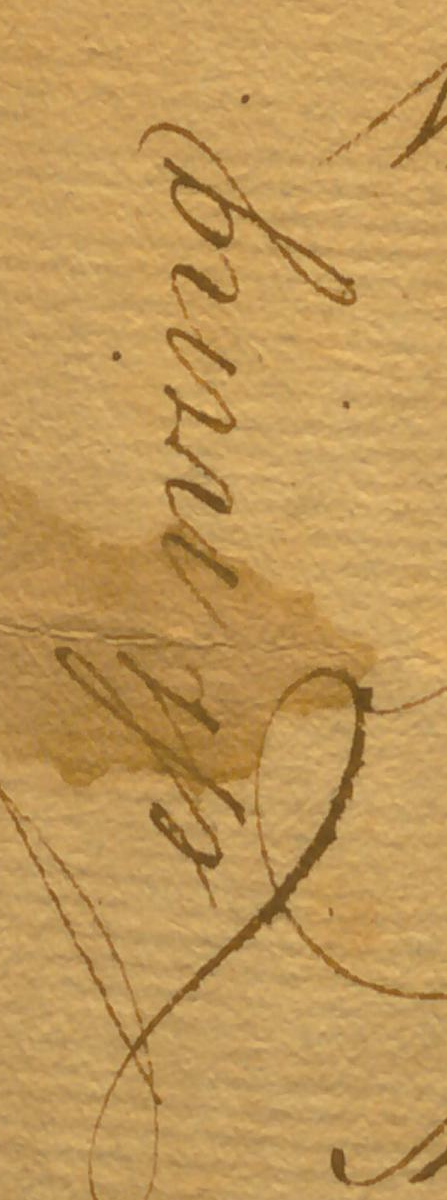Left wing
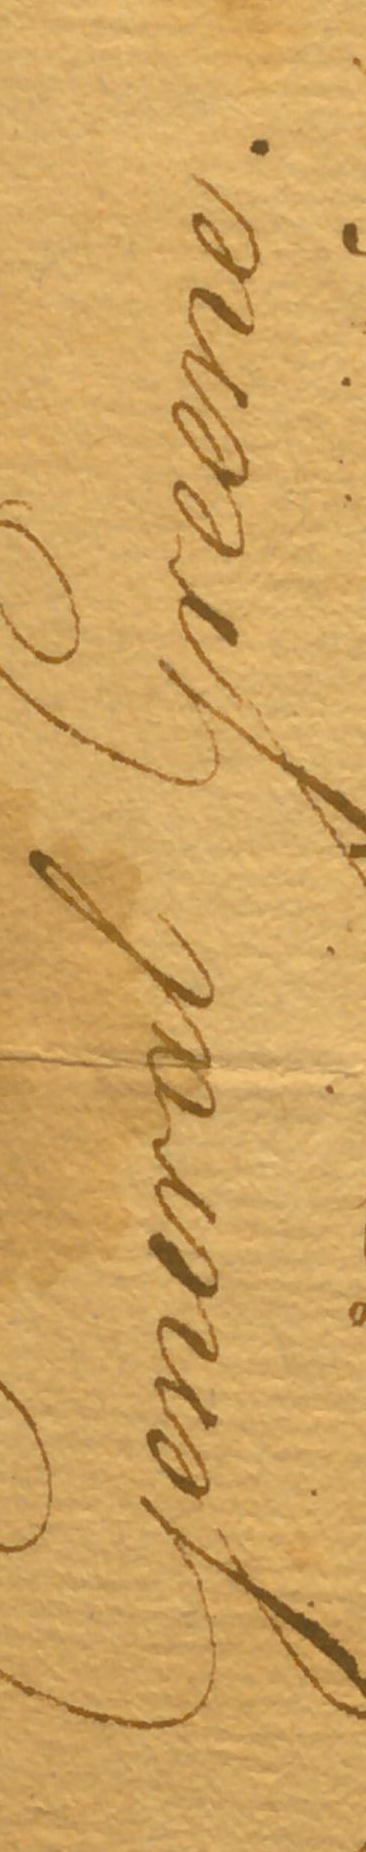General Greene.
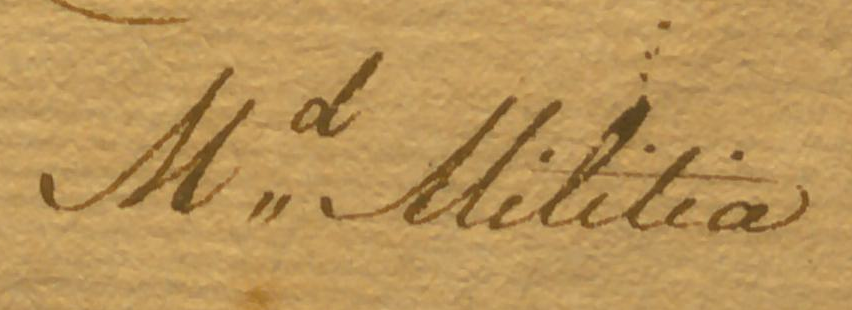M^d. Militia
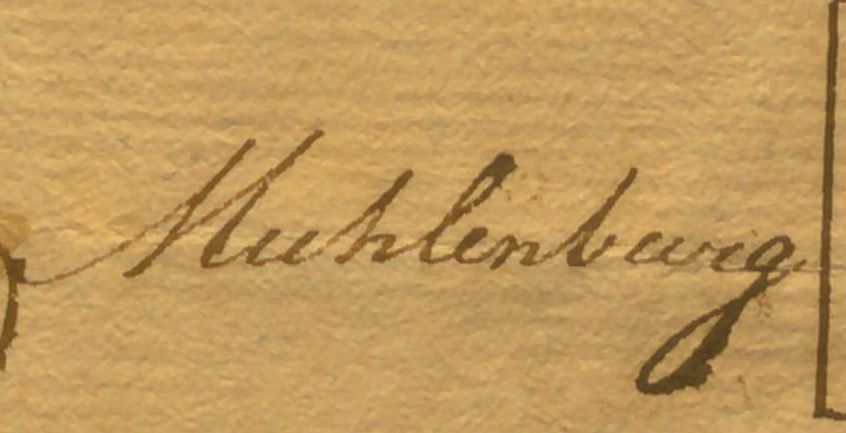Muhlenburg
